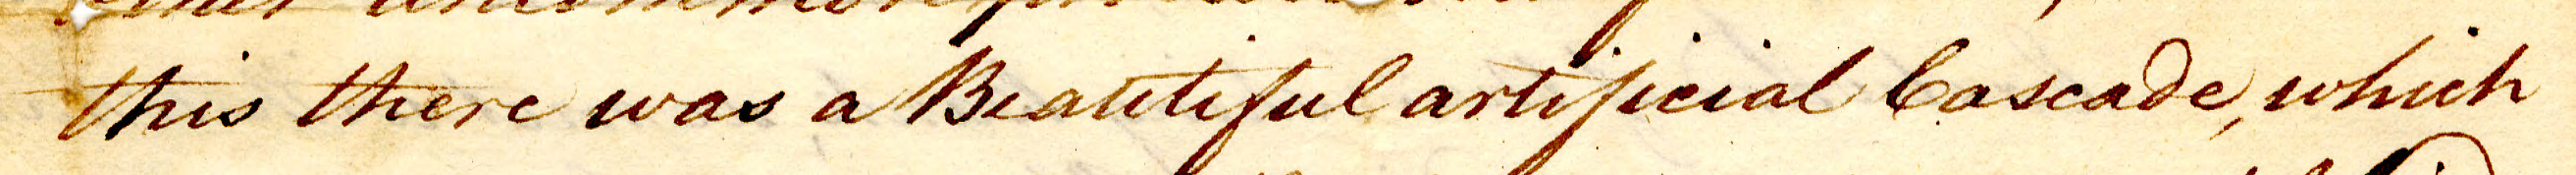this there was a Beautiful artificial Cascade, which
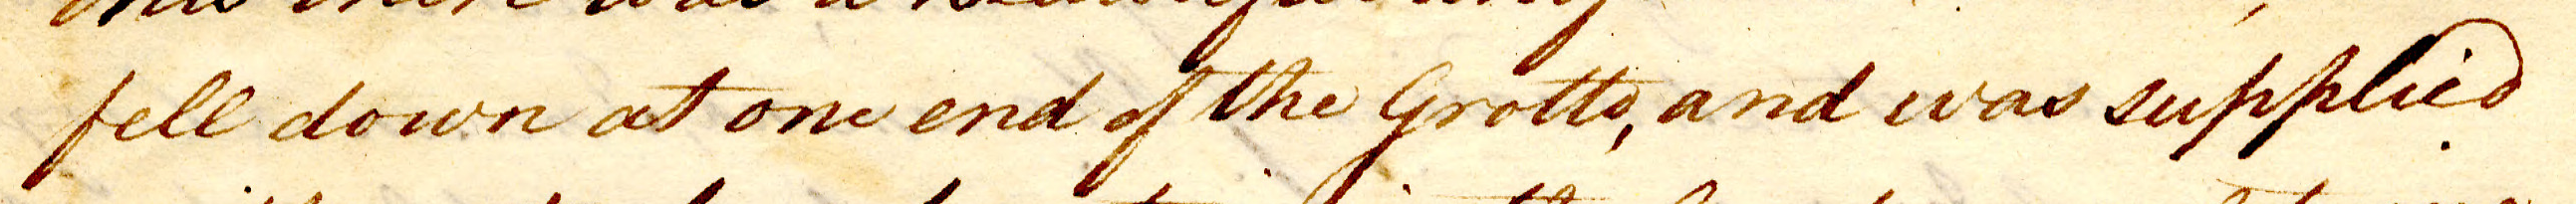fell down at one end of the Grotto, and was supplied
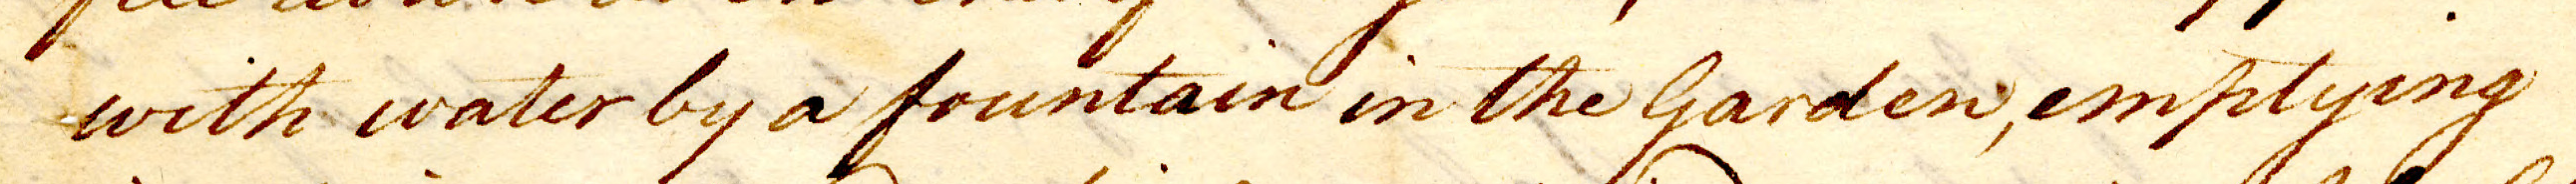with water by a fountain in the Garden, emptying
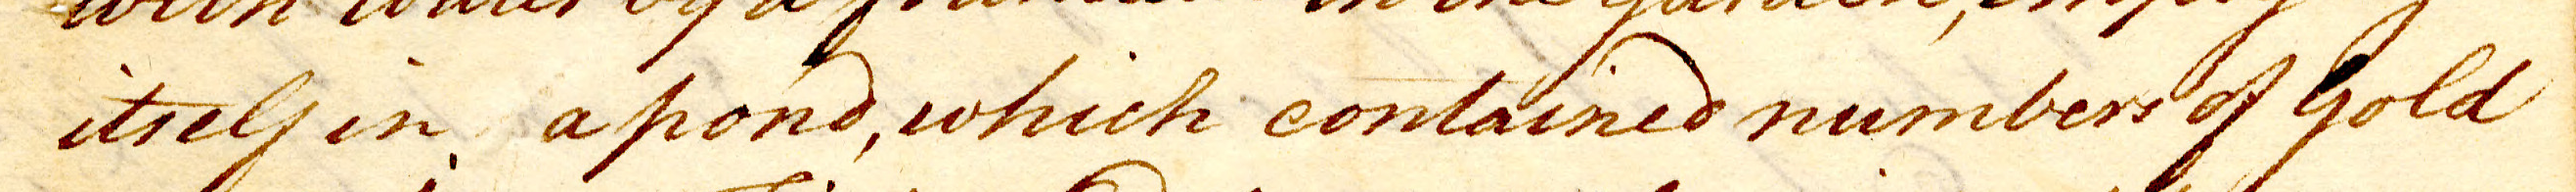itself in a pond, which contained numbers of Gold
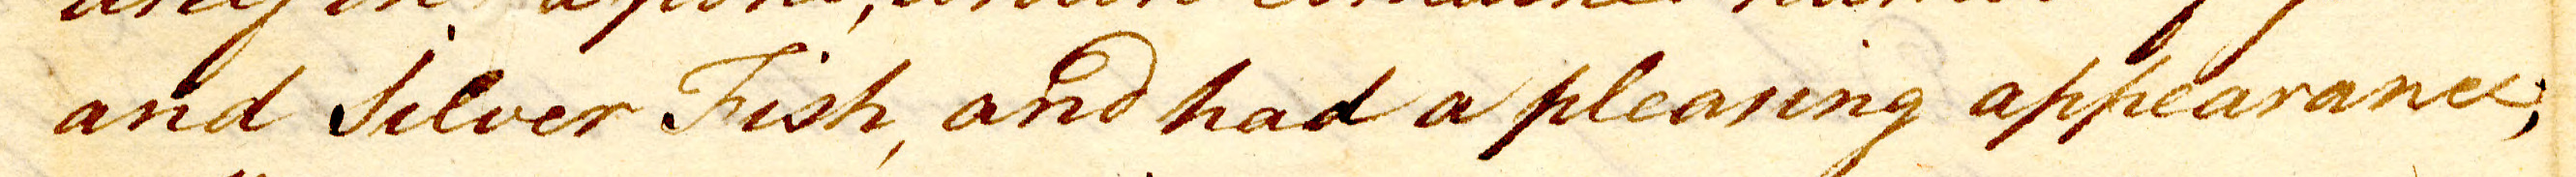and Silver Fish, and had a pleasing appearance;
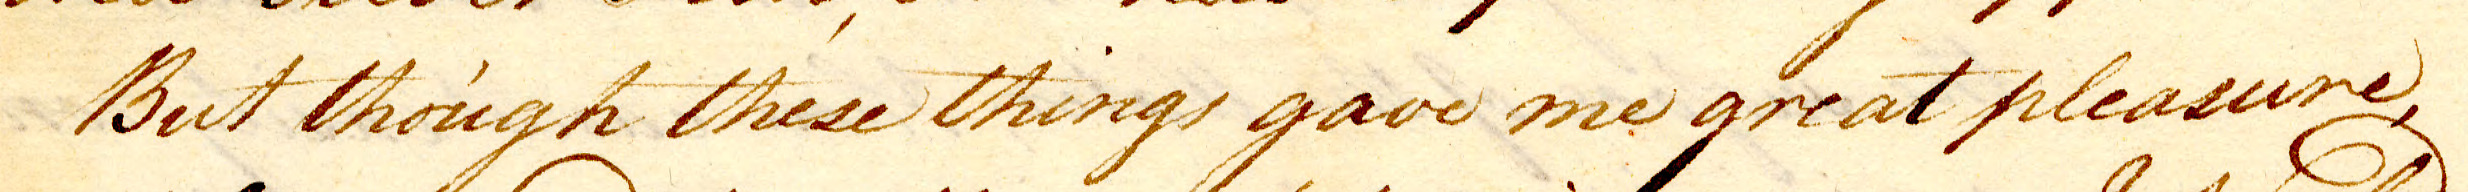But though these things gave me great pleasure,
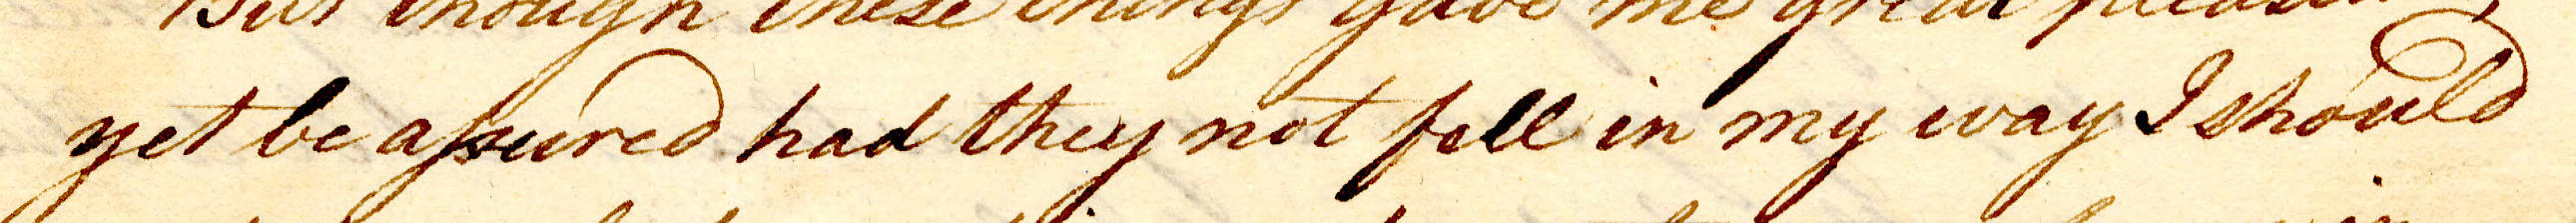yet be assured had they not fell in my way I should
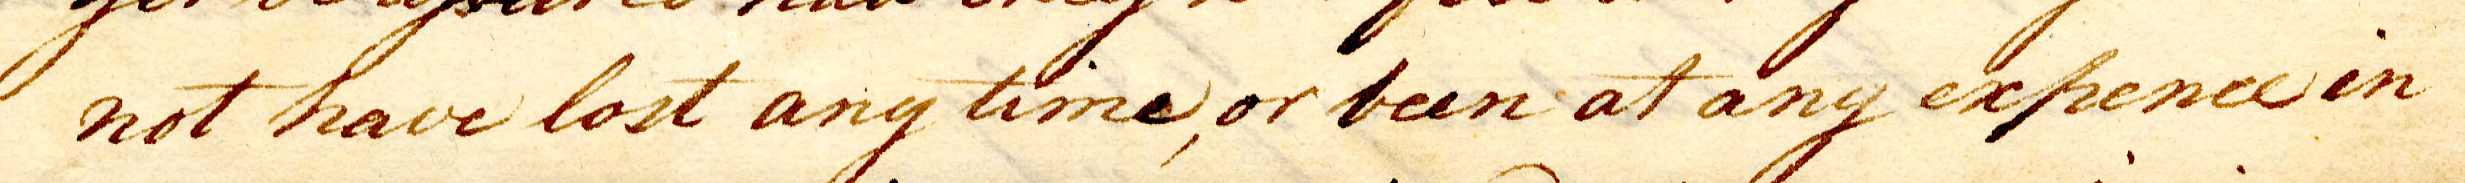not have lost any time, or been at any expence in
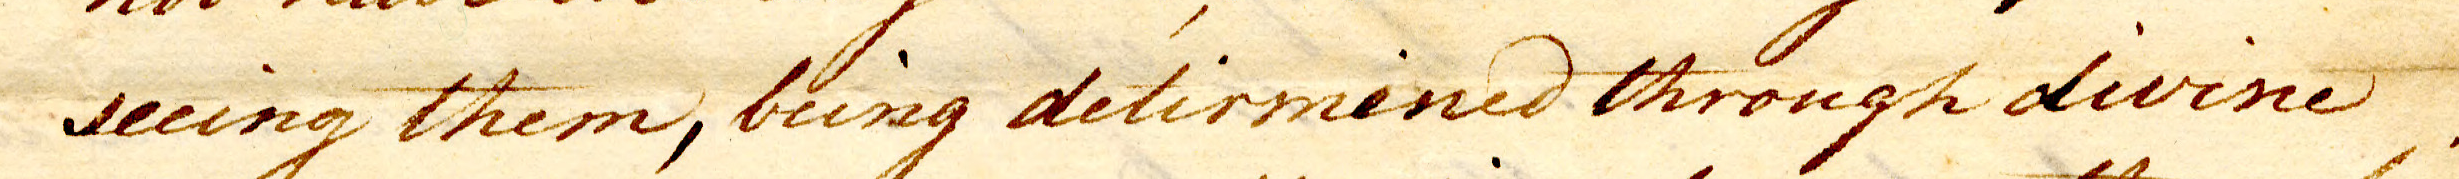seeing them, being detirmined through divine
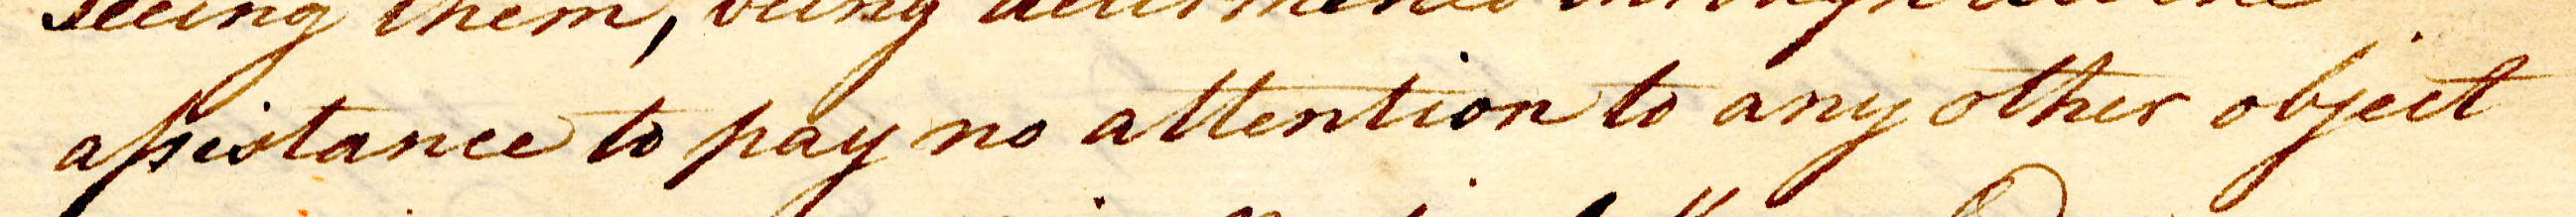assistance to pay no attention to any other object
